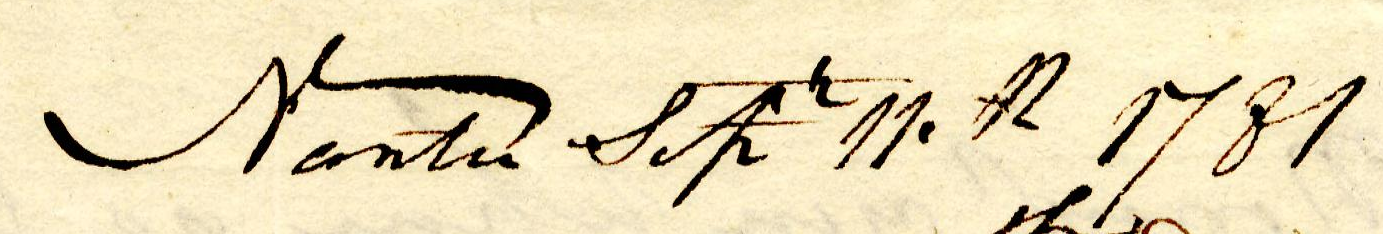Nantes Sept^r 11^th. 1781
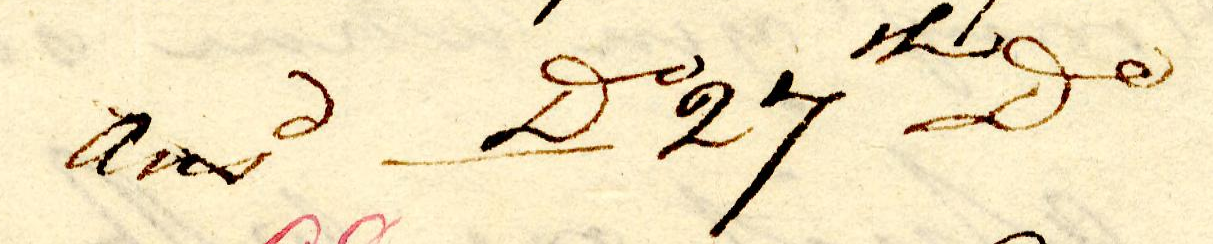ans^d D^o 27^th D^o
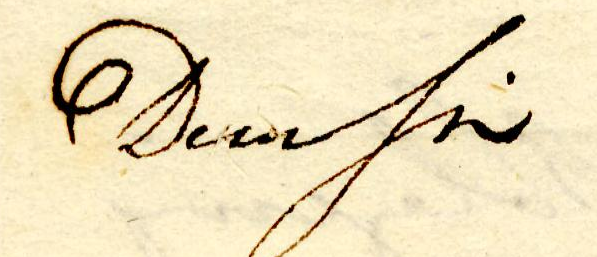Dear Sir
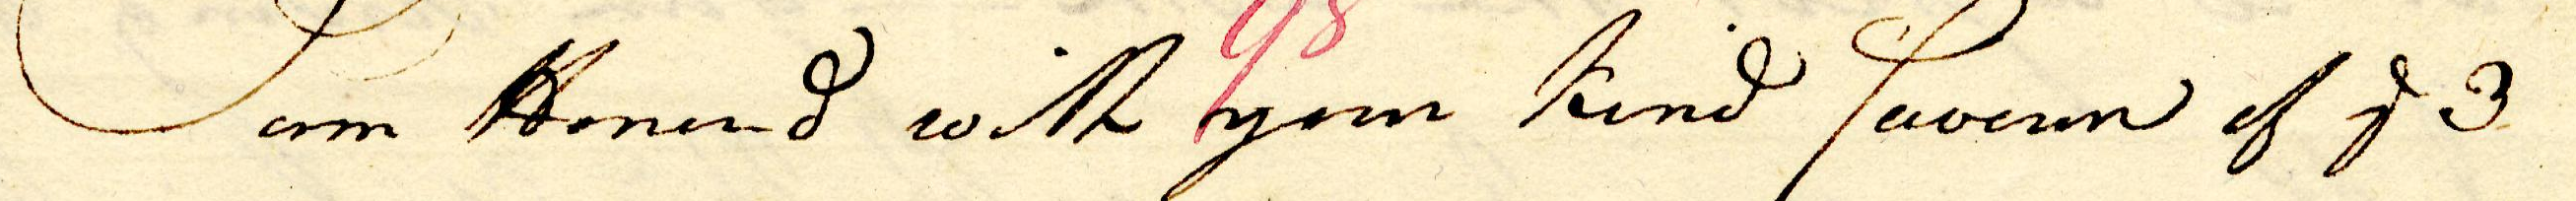I am Honord with your kind favour of y^e 3
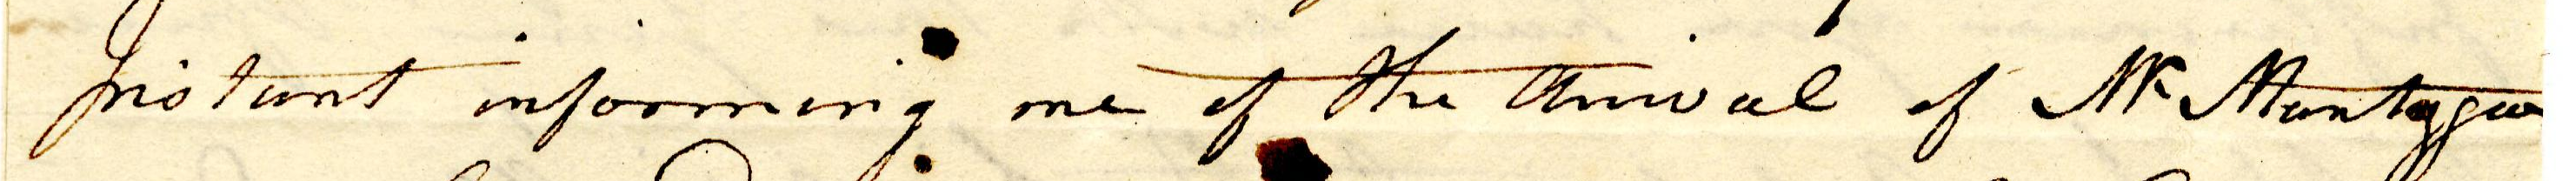Instant informing me of the Arrival of M^r. Montague
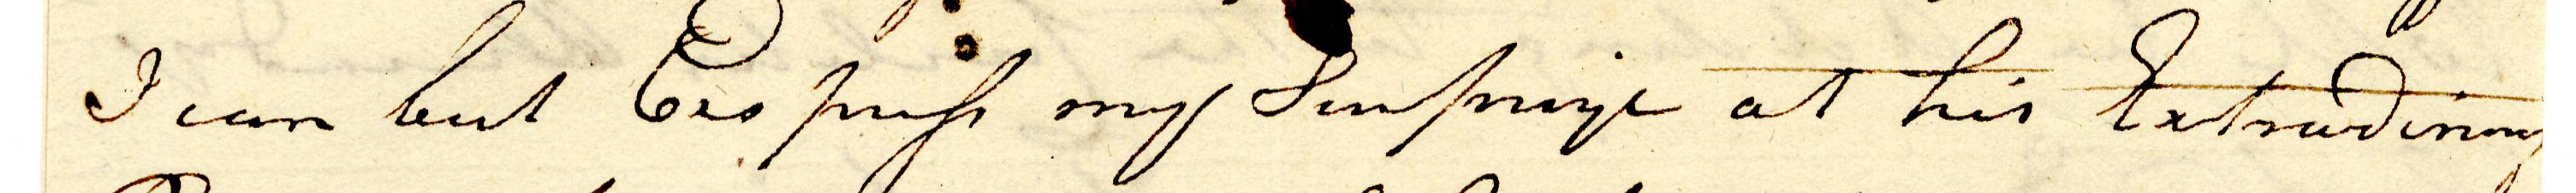I can but Express my surprize at his Extraordinary
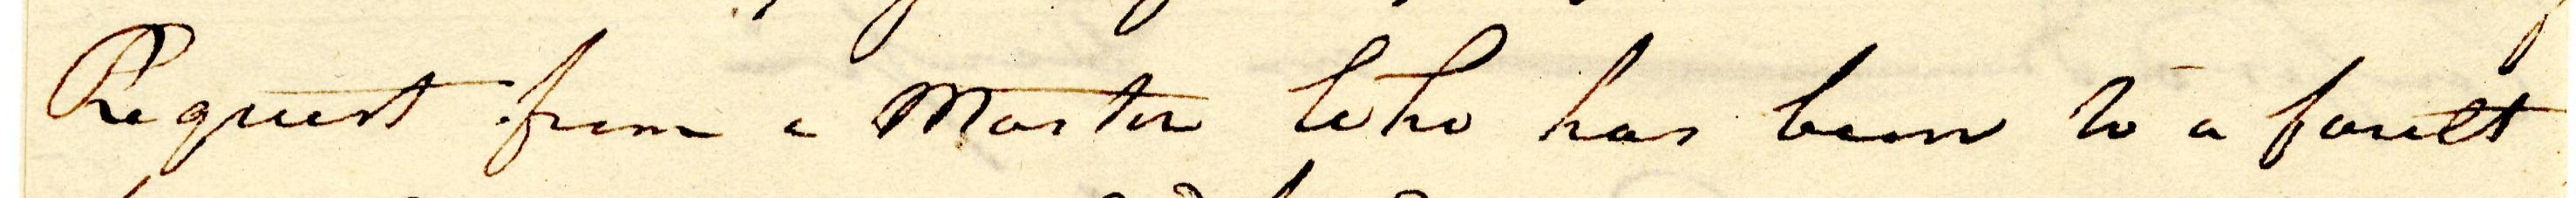Request from a Master who has been to a fault
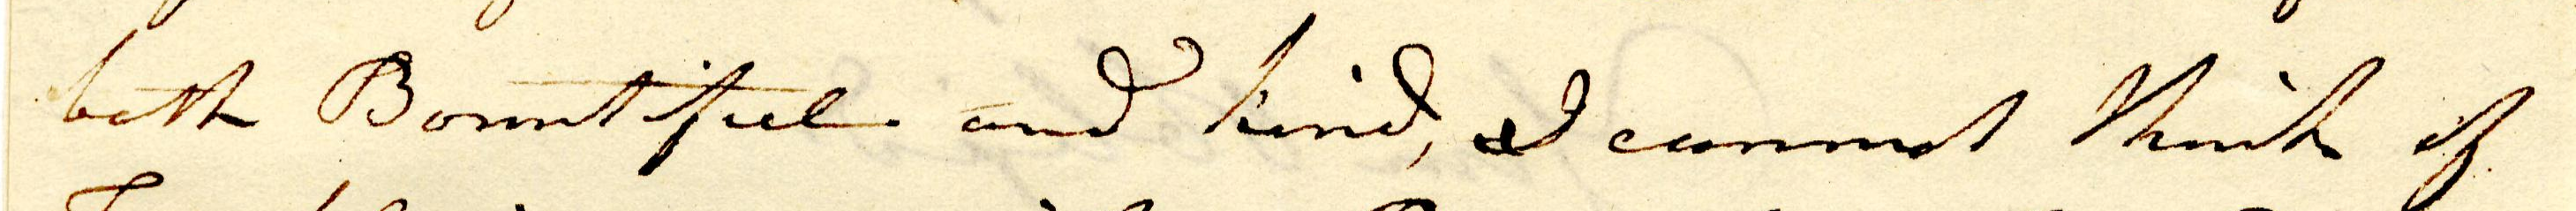both Bountiful and kind, I cannot think of
